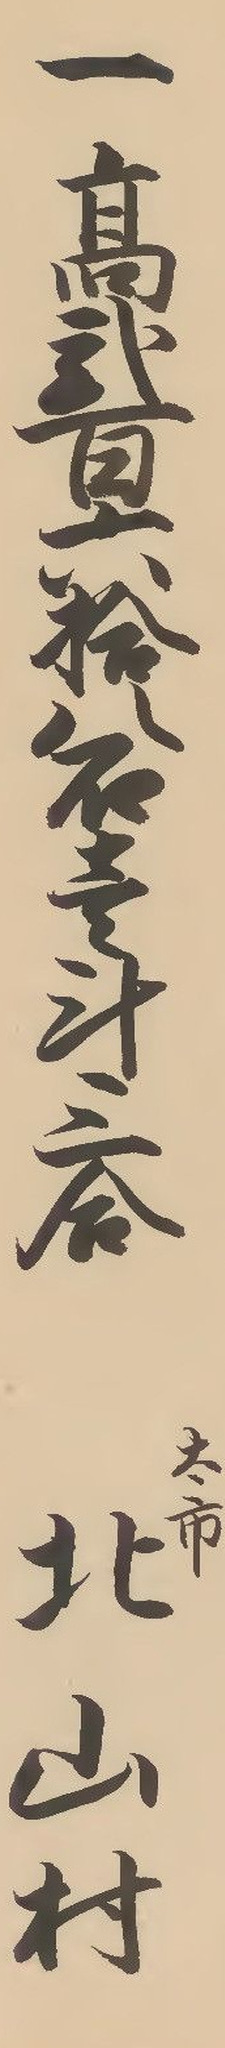一髙弐百六拾八石壱斗三合北山村

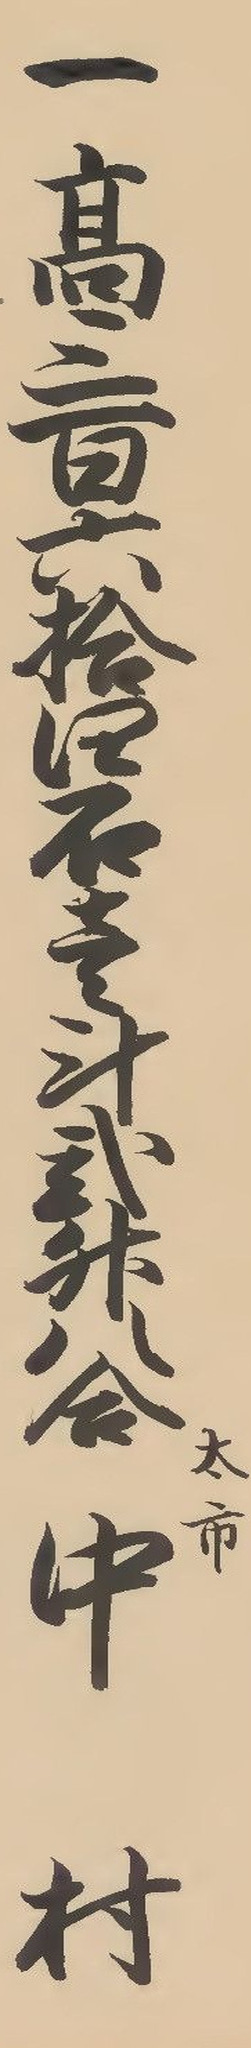一髙三百六拾四石壱斗弐升八合中村
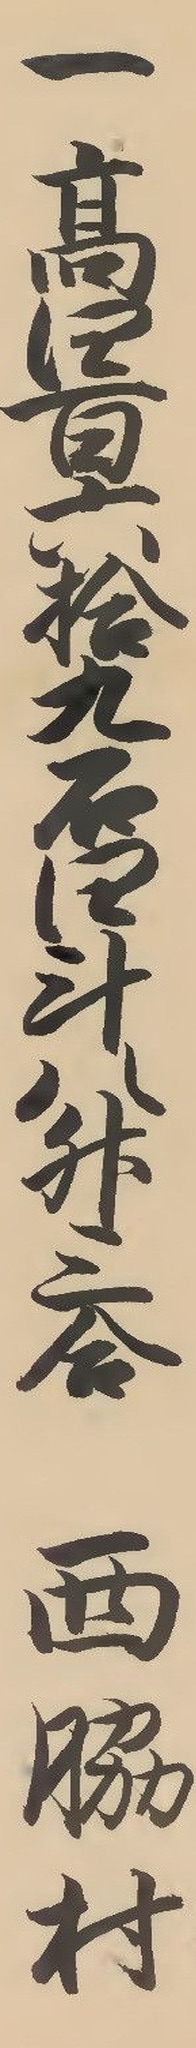一髙四百六拾九石四斗八升三合西脇村
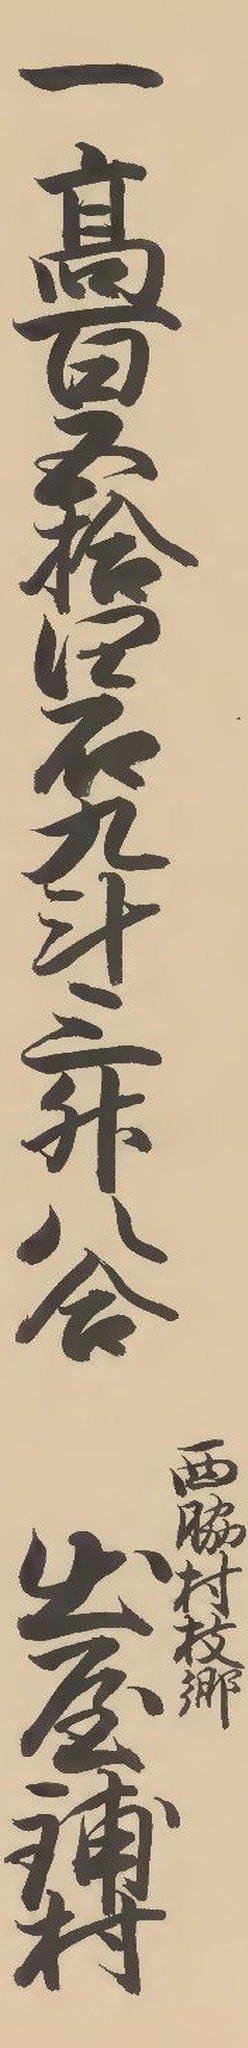一髙百五拾四石九斗三升八合出屋鋪村
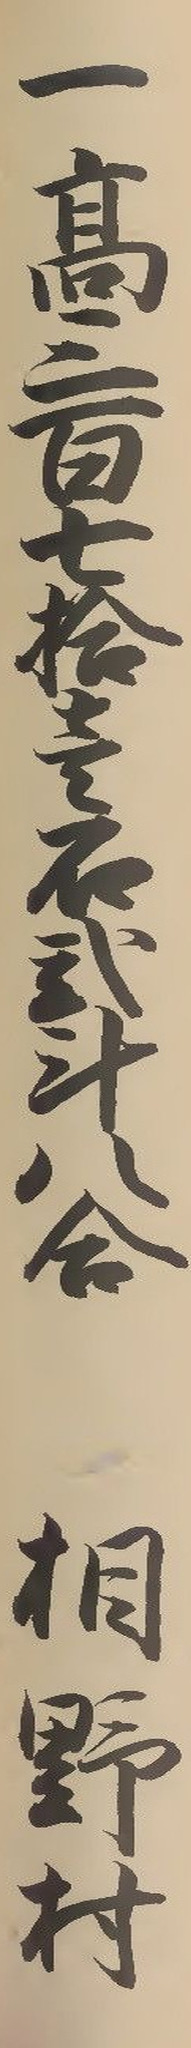一髙三百七拾壱石弐斗八合相野村
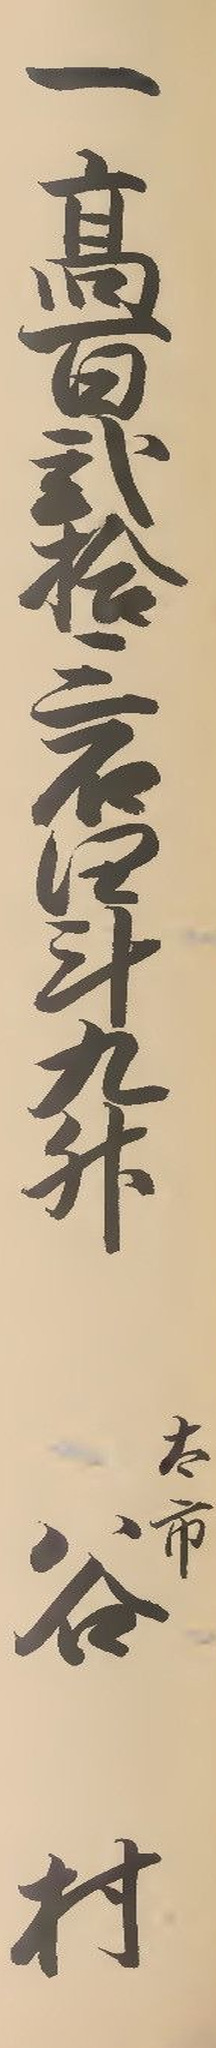一髙百弐拾三石四斗九升谷村
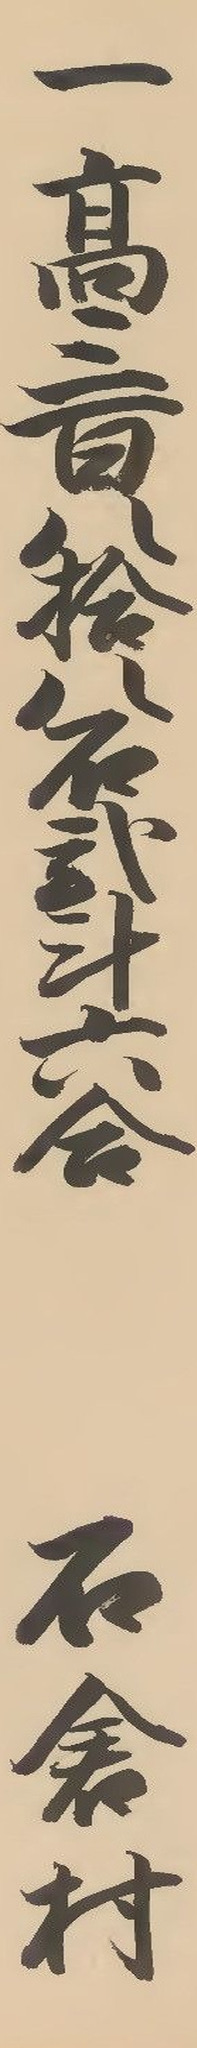一髙三百八拾八石弐斗六合石倉村
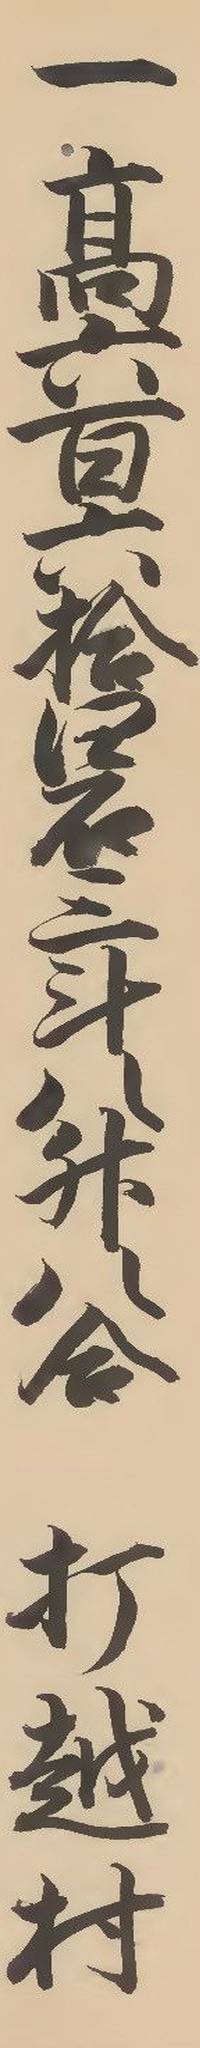一髙六百六拾四石三斗八升八合打越村
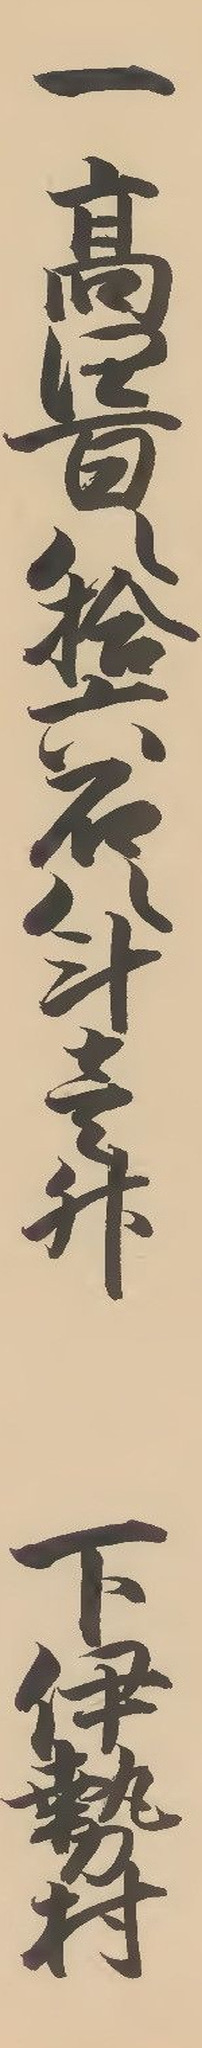一髙四百八拾六石八斗壱升下伊勢村

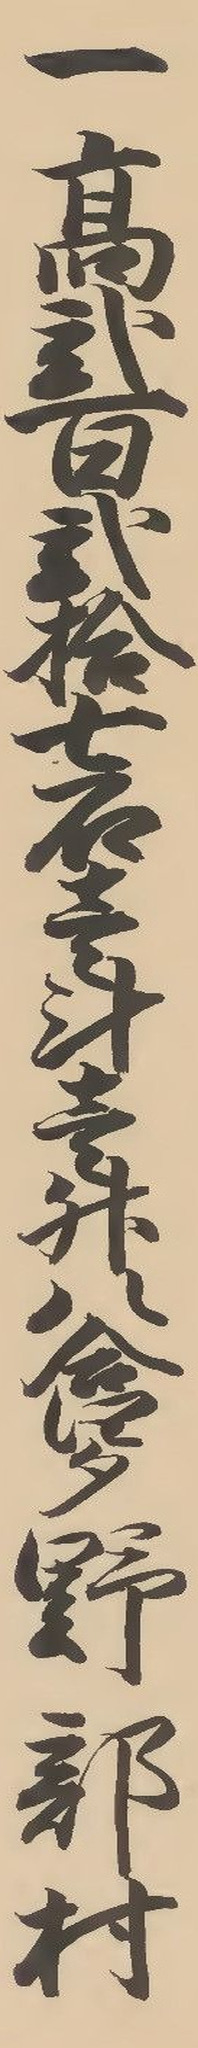一髙弐百弐拾七石壱斗壱升八合四夕野部村
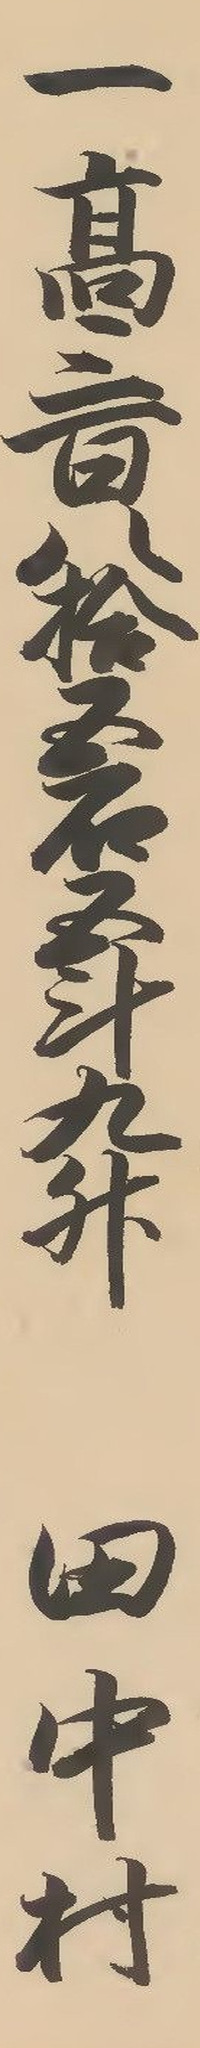一髙三百八拾五石五斗九升田中村
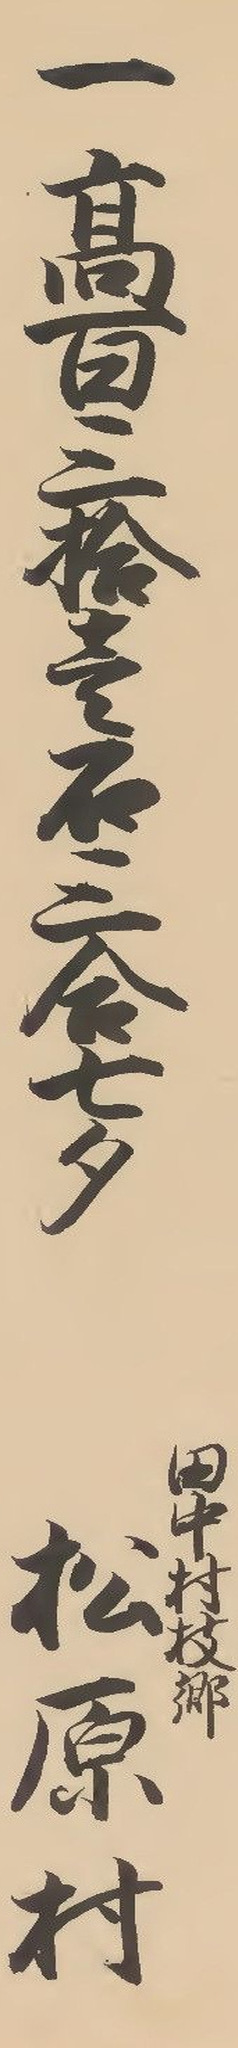一髙百三拾壱石三合七夕松原村
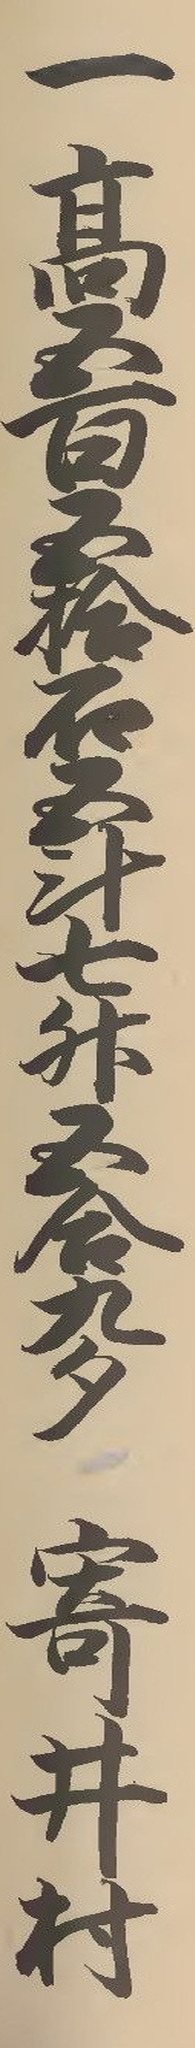一髙五百五拾石五斗七升五合九夕寄井村
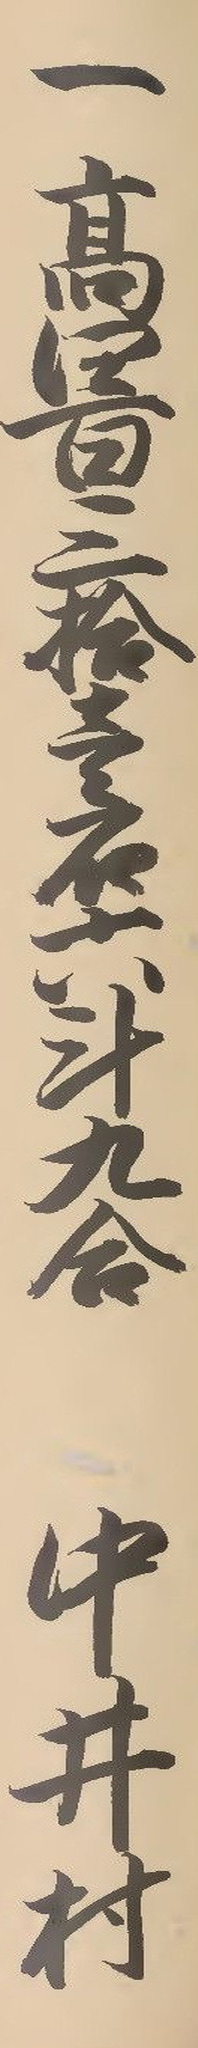一髙四百三拾壱石六斗九合中井村
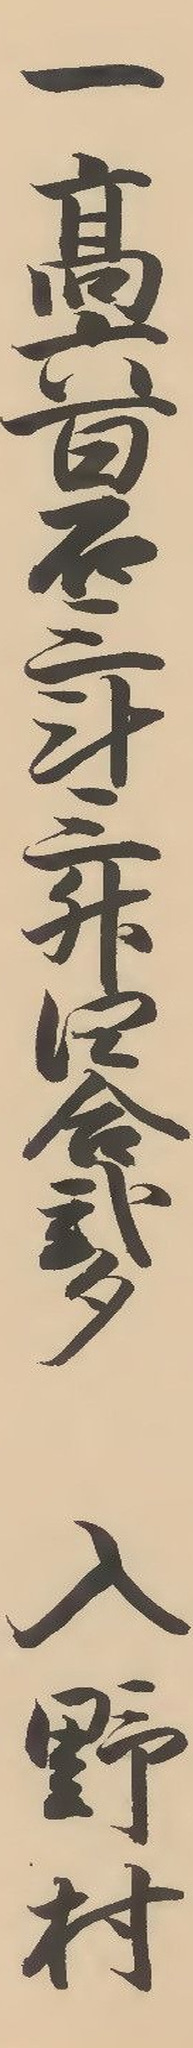一髙六百石三斗三升四合弐夕入野村
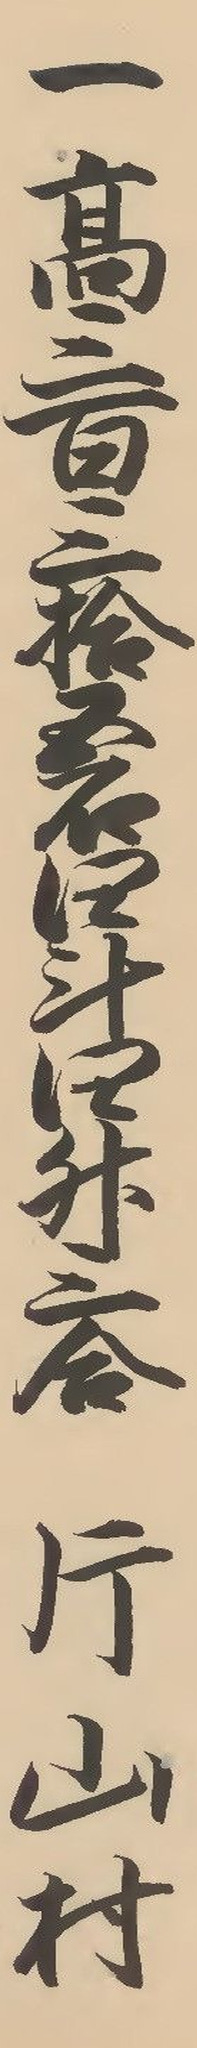一髙三百三拾五石四斗四升三合片山村
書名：播磨国郷帳
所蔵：国立公文書館 National Archives of Japan
